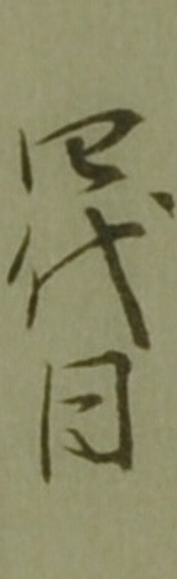四代目
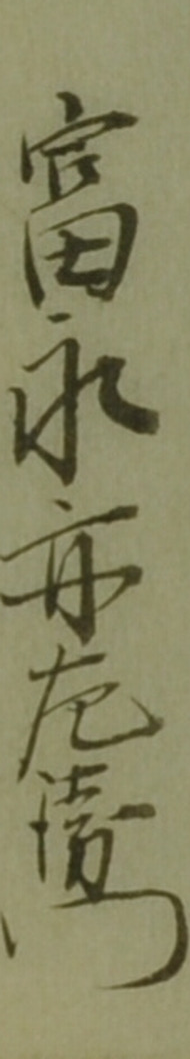富永亦左衛門
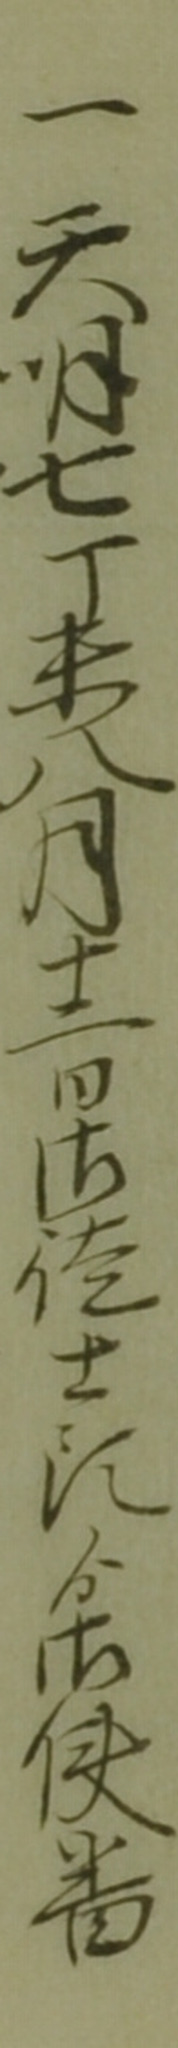一天明七丁未八月十二日御徒士頭御使番
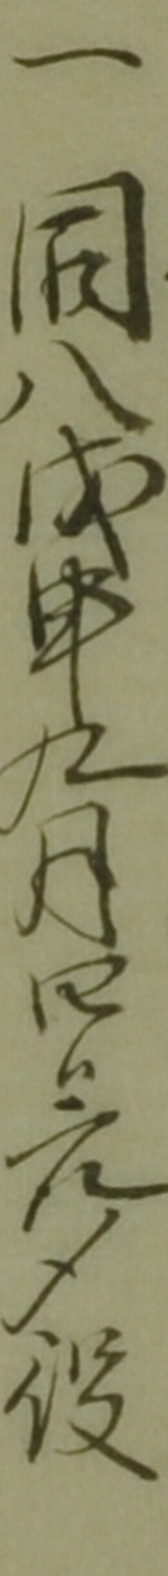一同八戊申九月四日元〆役
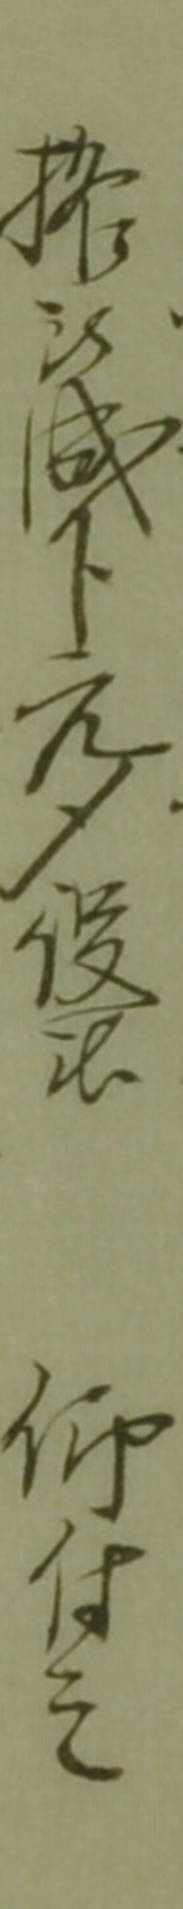格被成下元〆役被仰付之
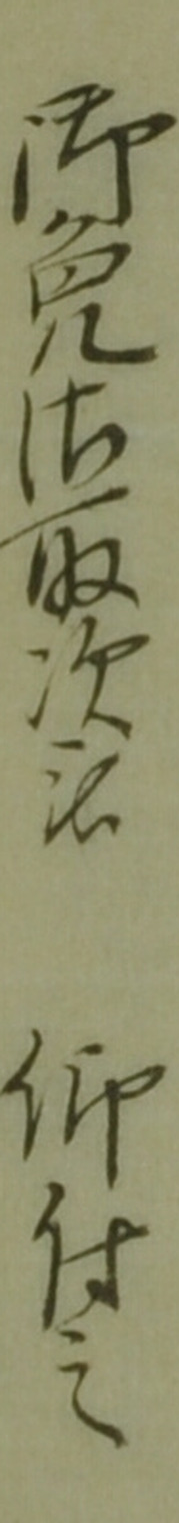御免御取次被仰付之
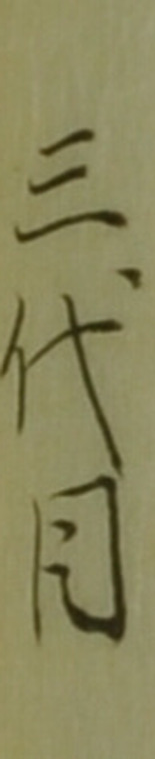三代目
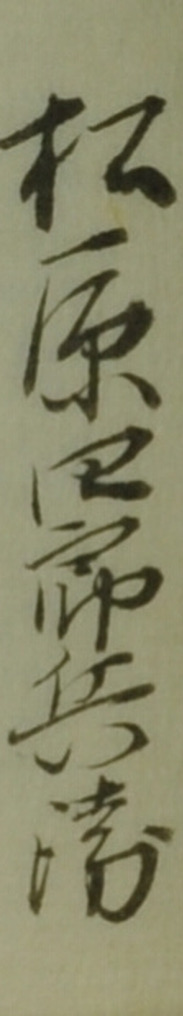松原四郎兵衛
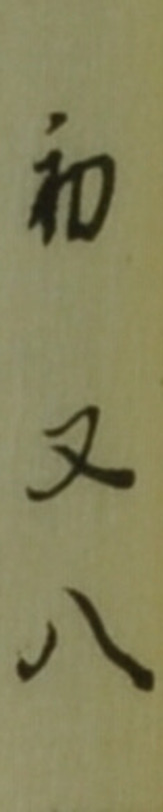初又八
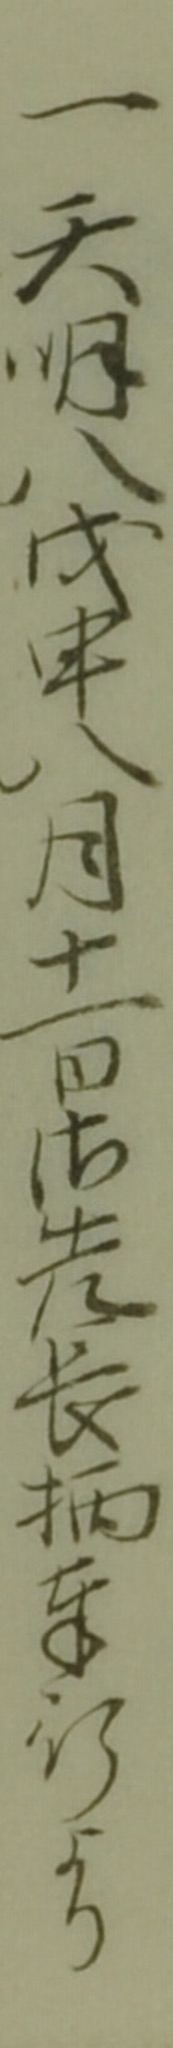一天明八戊申八月十一日御先長柄奉行より
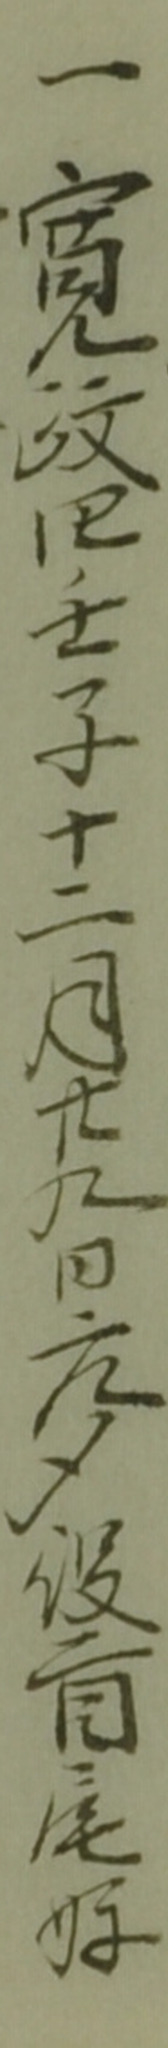一寛政四壬子十二月廿九日元〆役首尾好
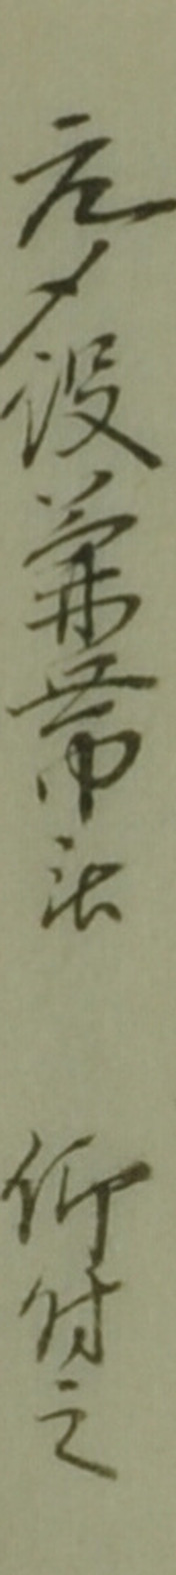元〆役兼帯被仰付之
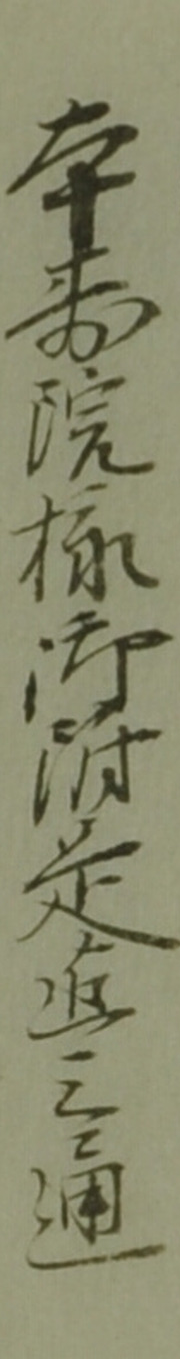本寿院様御附是迄之通
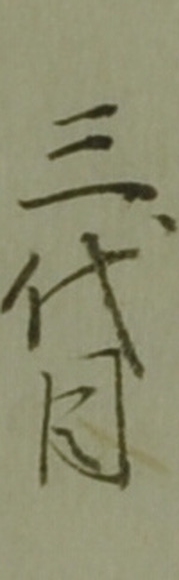三代目
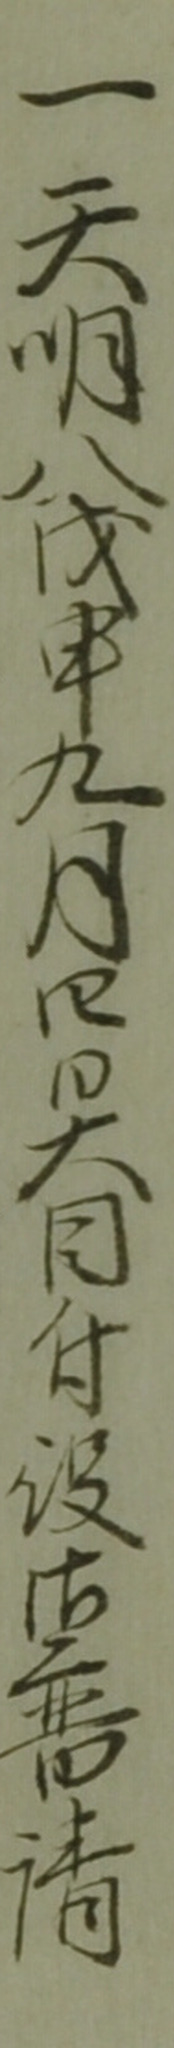一天明八戊申九月四日大目付役御普請
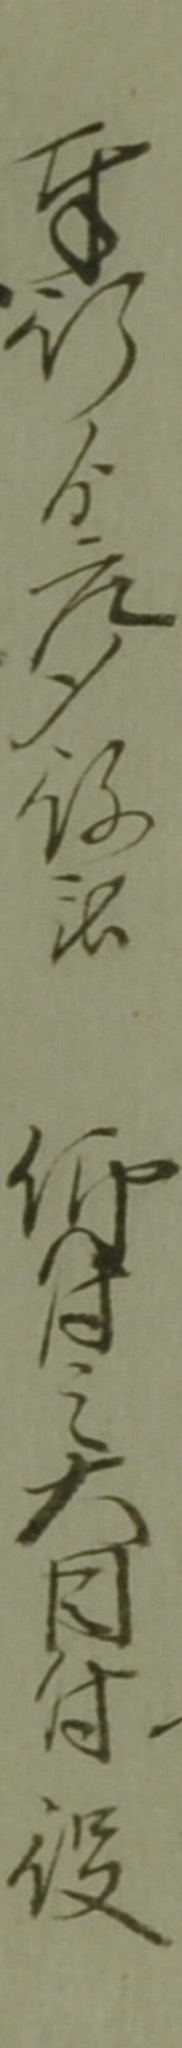奉行ゟ元〆役被仰付之大目付役
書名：諸御役代々録（七）
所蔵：伊那市立高遠町図書館・合同会社AMANE
